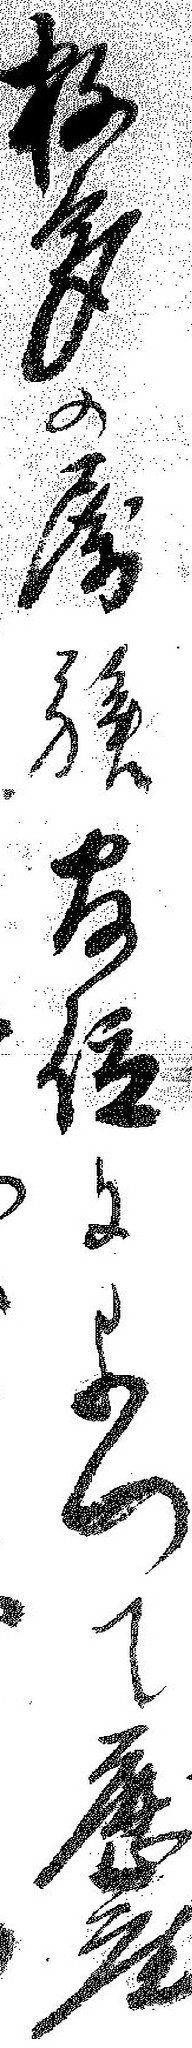数多の属族官位によつて歴座
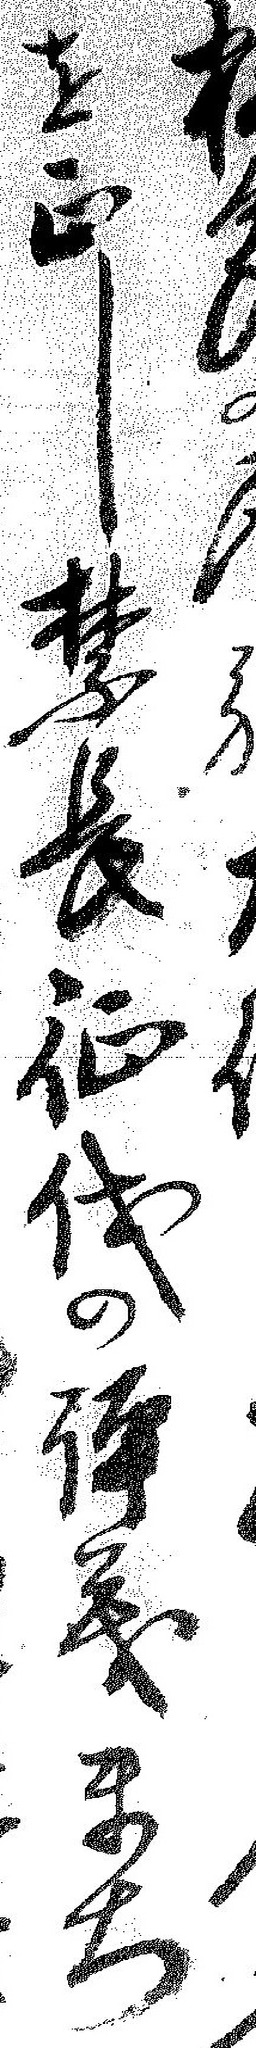を正し禁長征伐の評義まち
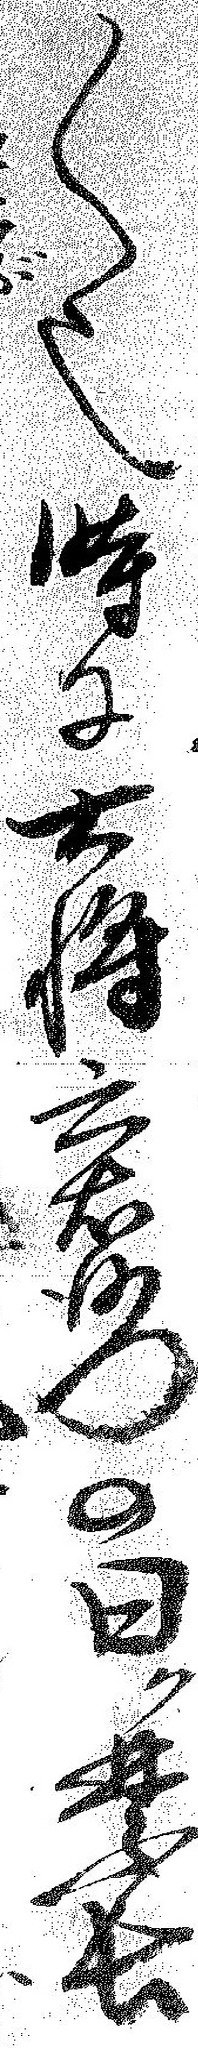〳〵也時に大将六右衛門の曰く禁長
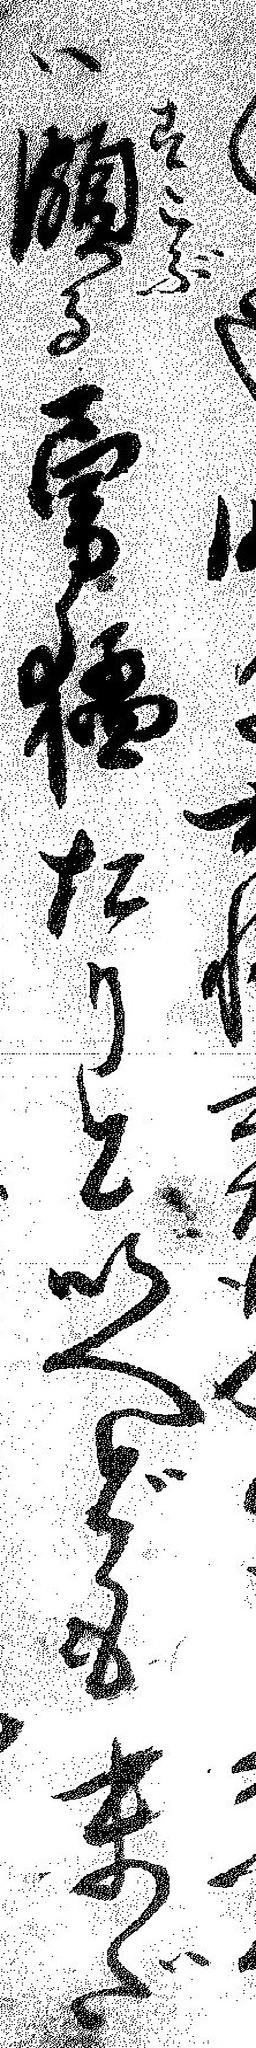は頗る勇猛たりといへどもまだ
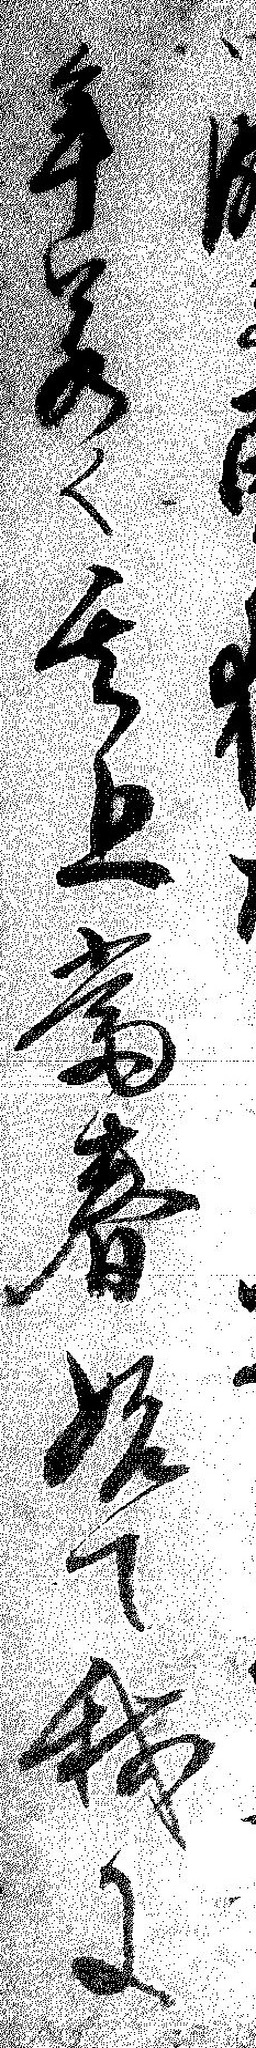年若く其上当春始て我に

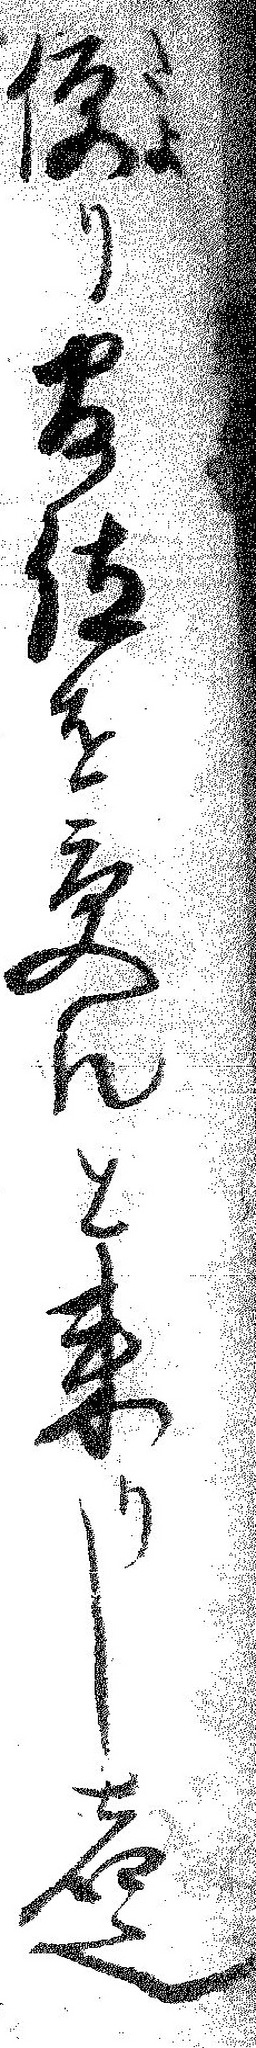便り官位を受んと来りし者也
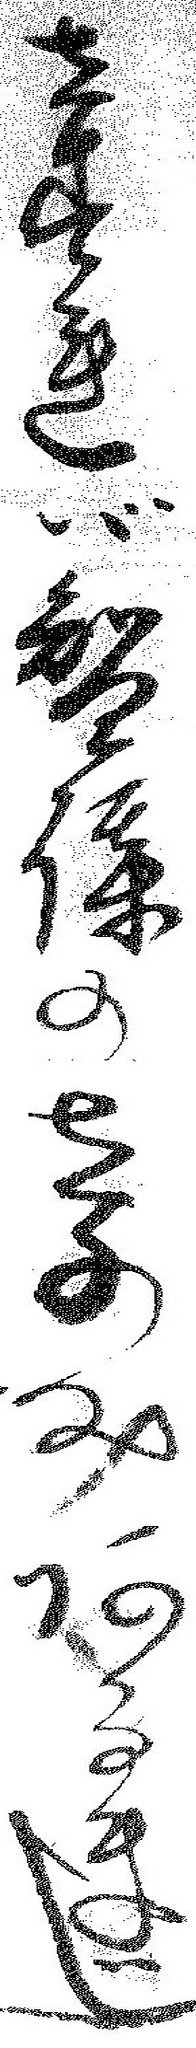さすれば智謀のさのみあるまじ
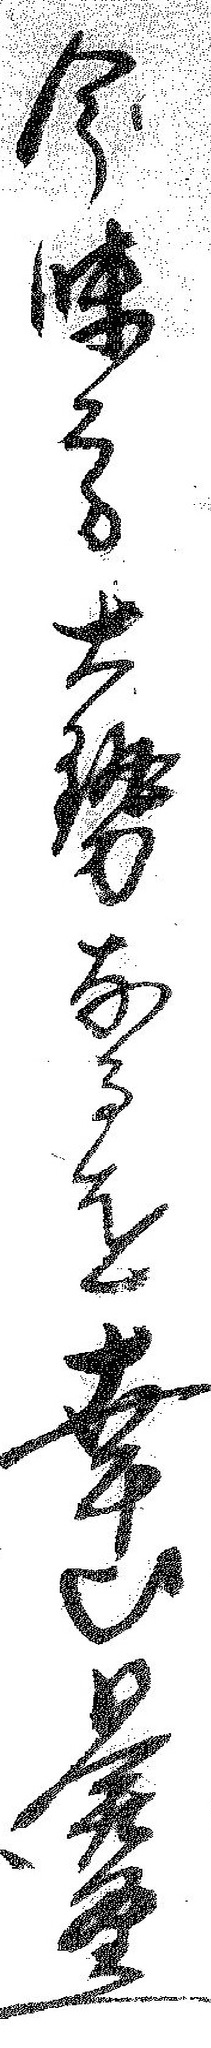今味方大勢なるを幸ひ日開野へ
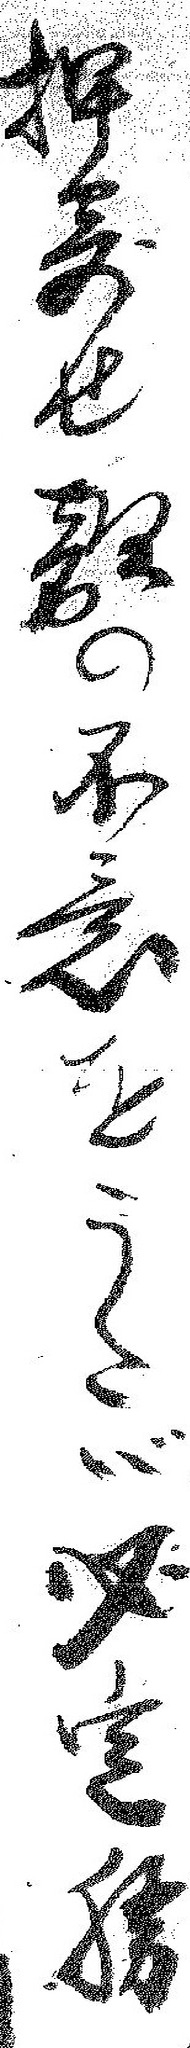押寄せ敵の不意をうたば必定勝
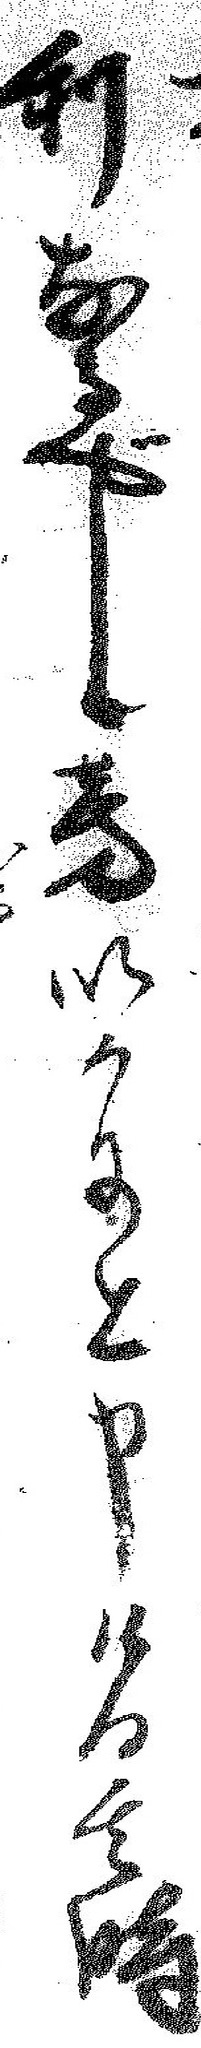利なるべし旁いかにと申ける其時
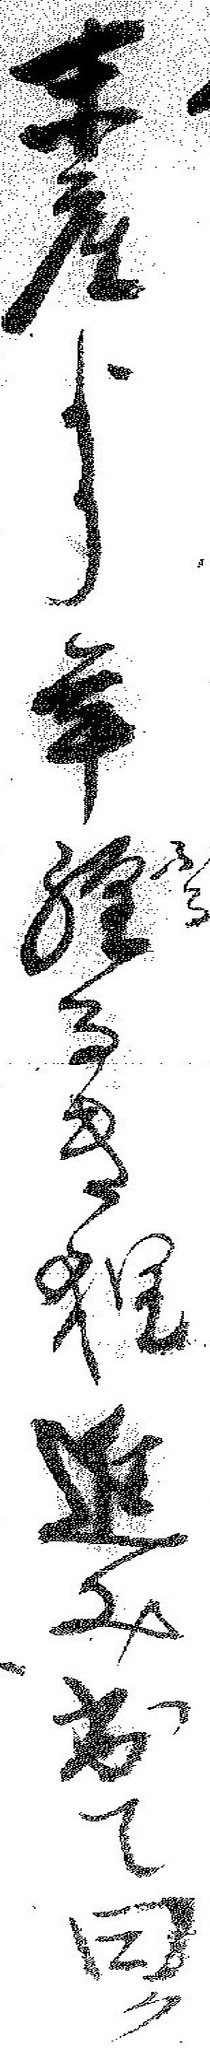末座より年経るき狸進み出て曰く
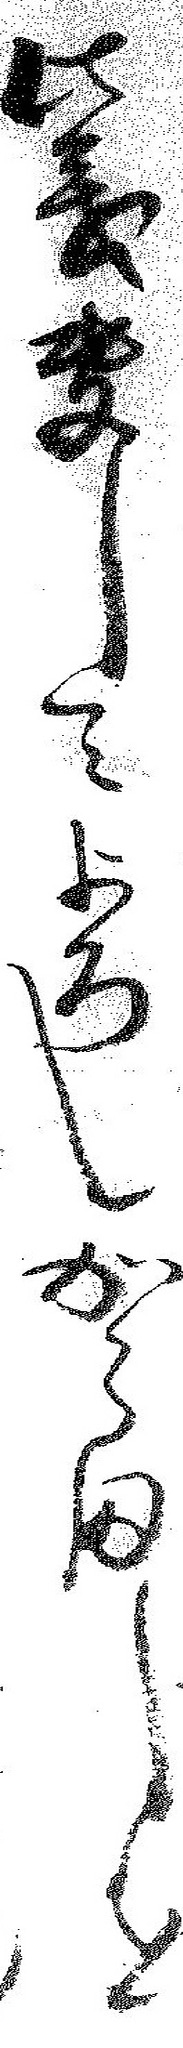此義決してよろしからまじと
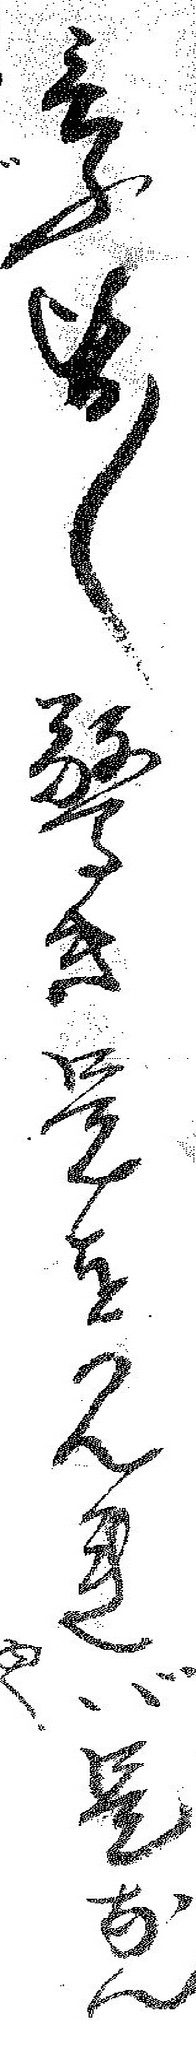云ふ皆〳〵驚き是を見れば是なん
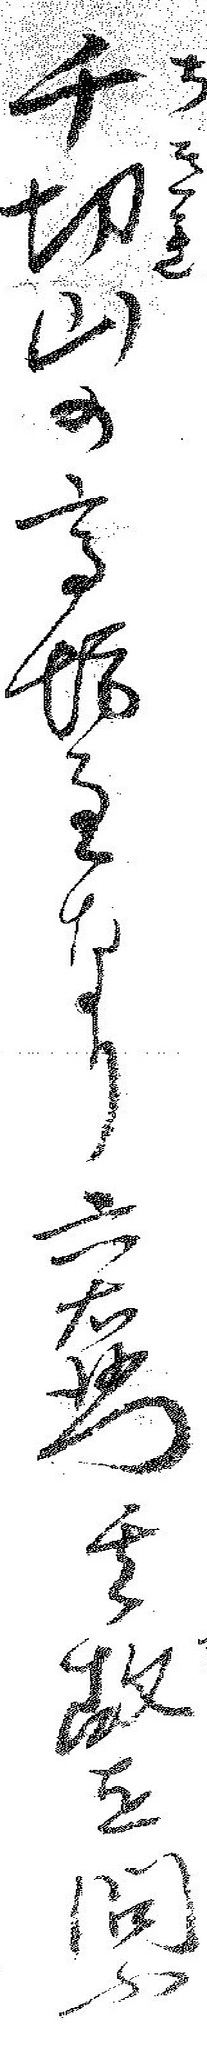千切山の高坊主なり六右衛門其故を問ふ
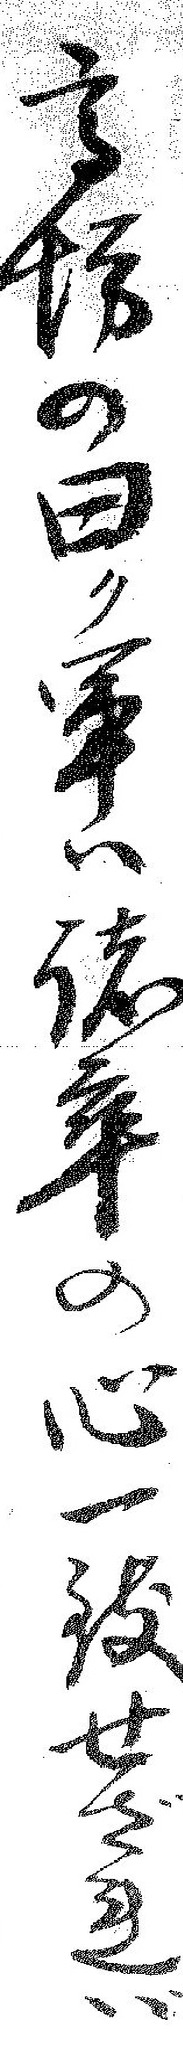高坊の曰く軍は諸卒の心一致せざれば
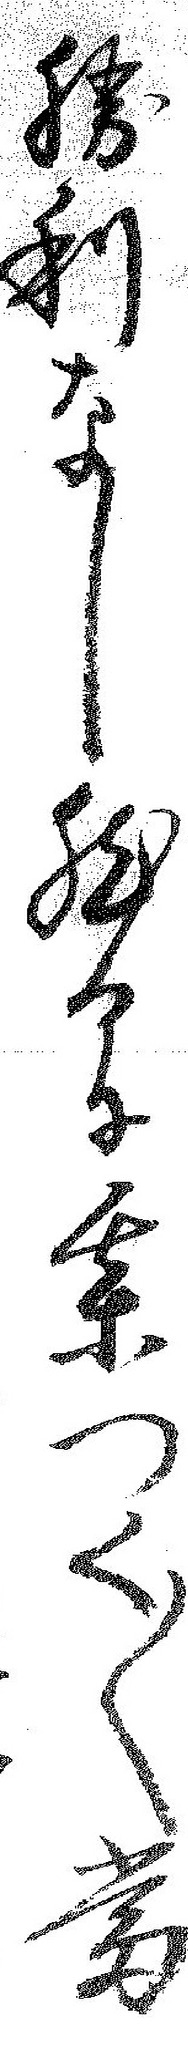勝利なし然るに某つく〳〵当
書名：近頃古狸珍説　礼義智信
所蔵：徳島県立図書館
